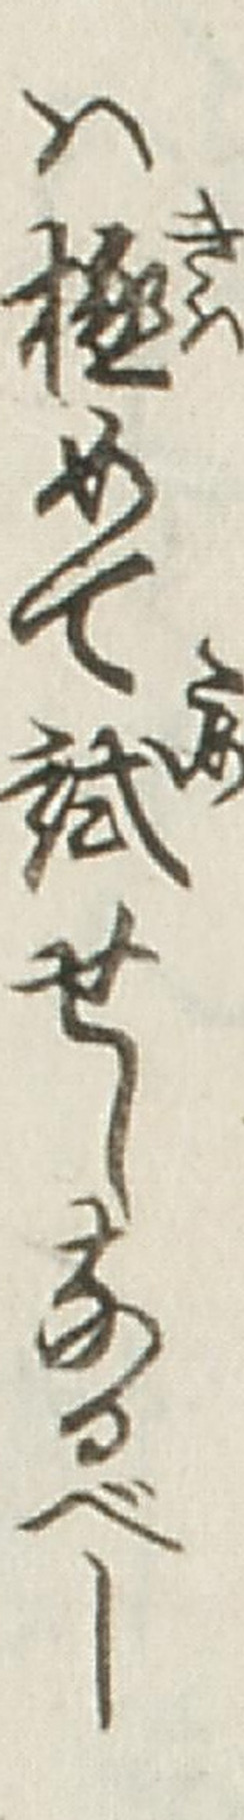は極めて試せしなるべし
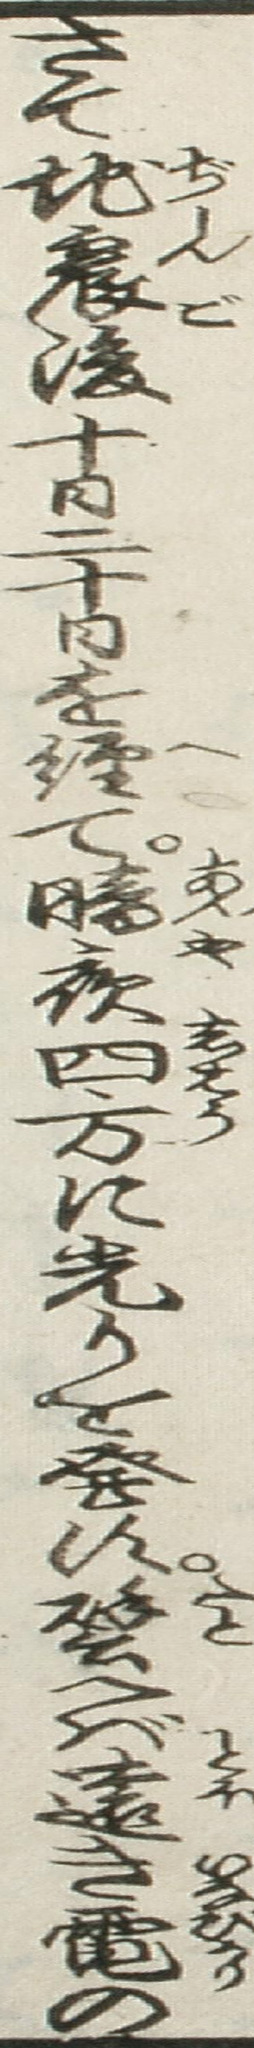さて地震後十月二十日を経て。暗夜四方に光りを発す。譬へば遠き電の
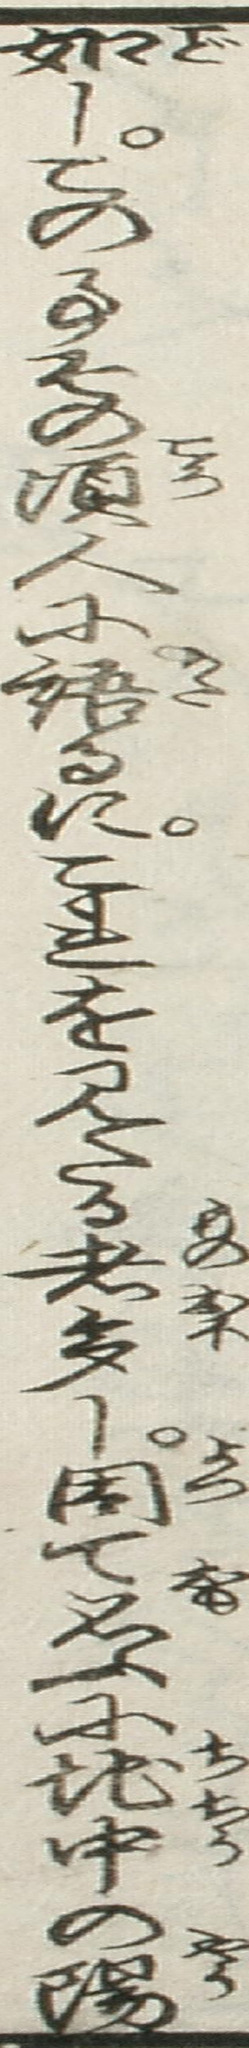如し。この事その頃人に語るに。これを見たる者多し。因て思ふに地中の陽
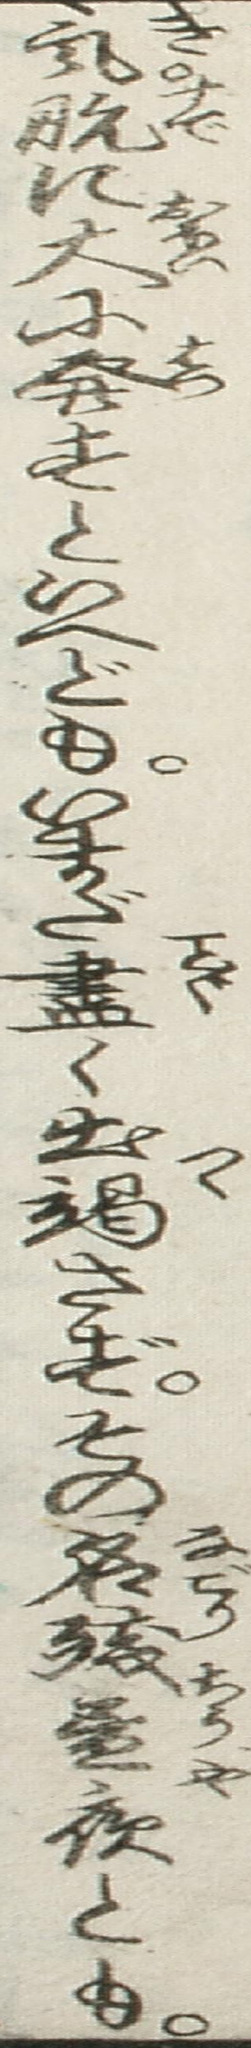気既に大に発すといへども。いまだ悉く出竭さず。その名残昼夜とも。
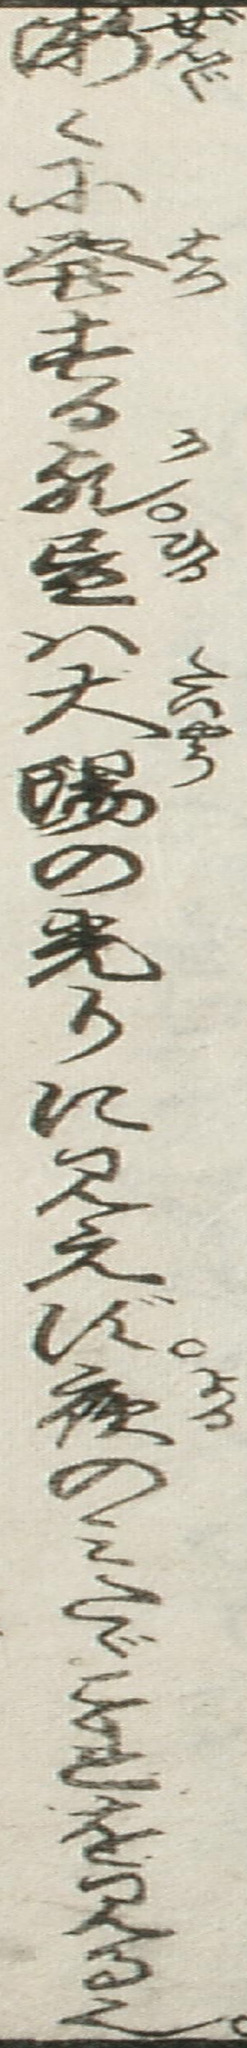漸々に発する歟。昼は大陽の光りに見えず。夜のみたゞこれを見る也。
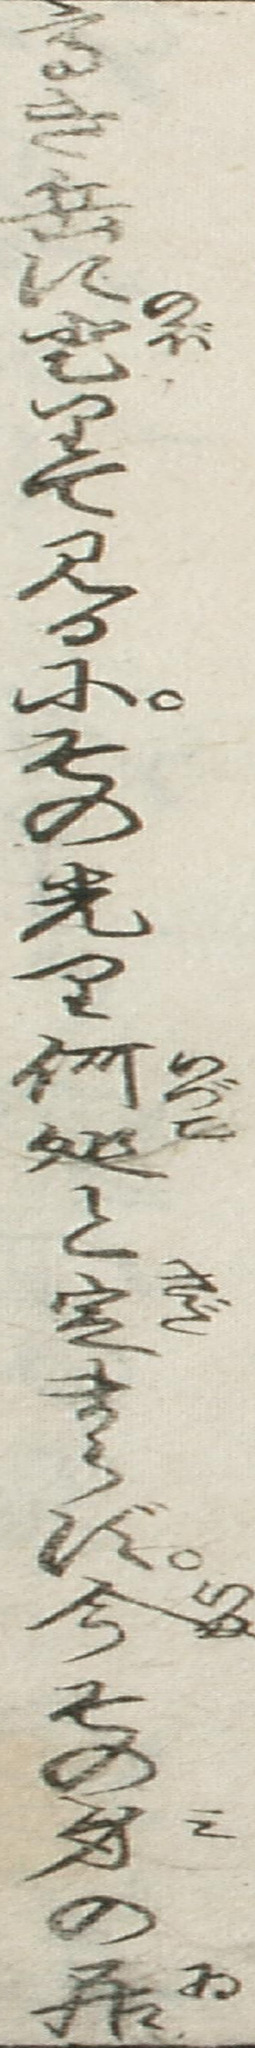高き丘に登りて見るに。その光り何処と定まらず。今その身の居
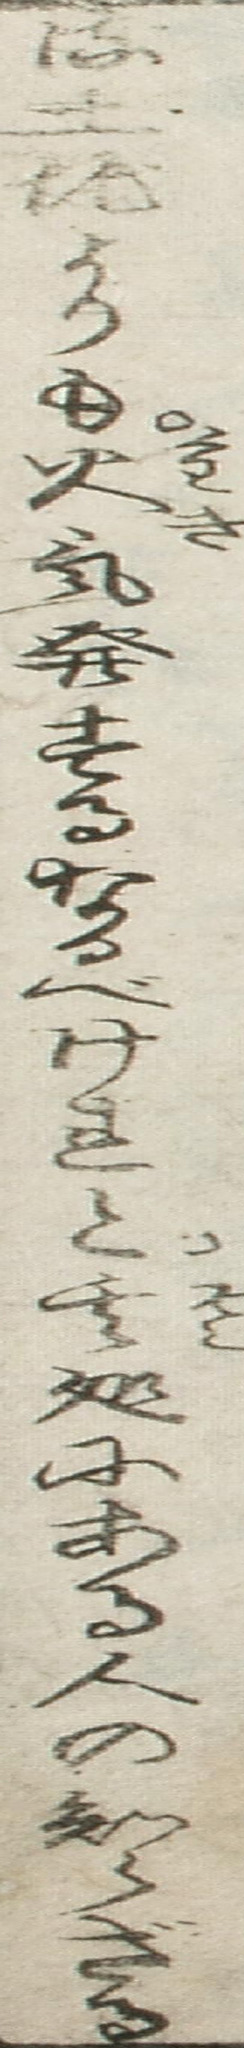る土地よりも。火気発するなるべけれと。其処にある人の知らざる

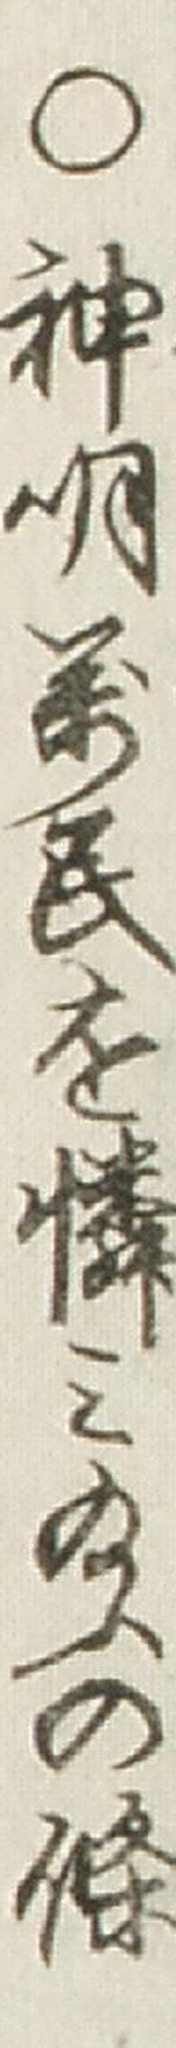◯神明万民を憐み給ふの條
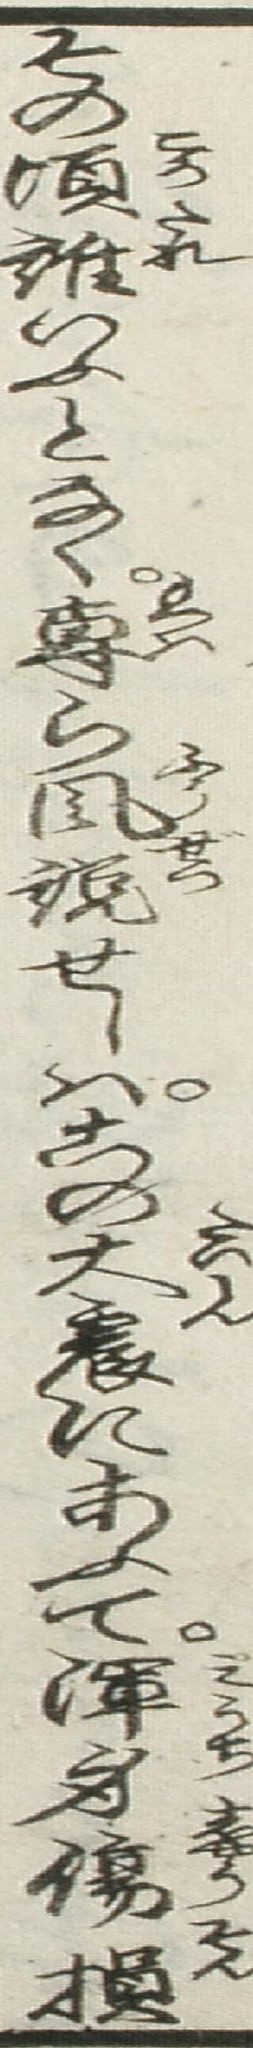その頃誰いふとなく。専ら風説せしは。この大震にあふて渾身傷損
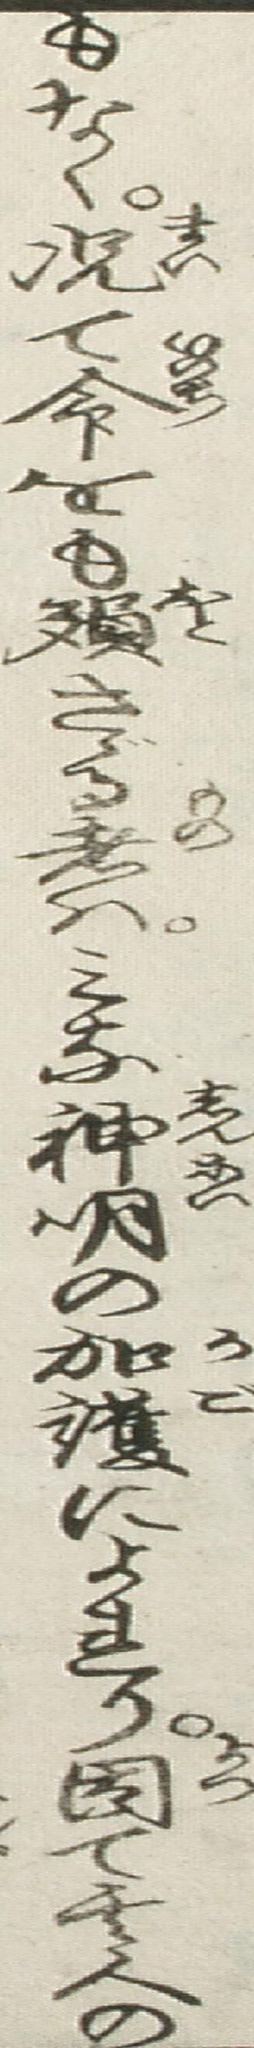もなく。況て命をも殞さゞる者は。みな神明の加護によれり。因て其人の
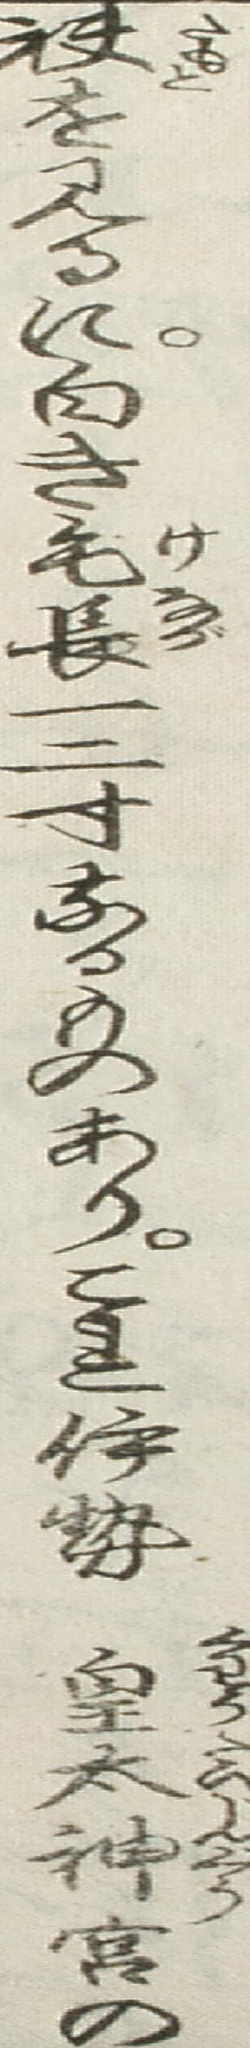袂を見るに。白き毛長一二寸なるものあり。これ伊勢皇太神宮の
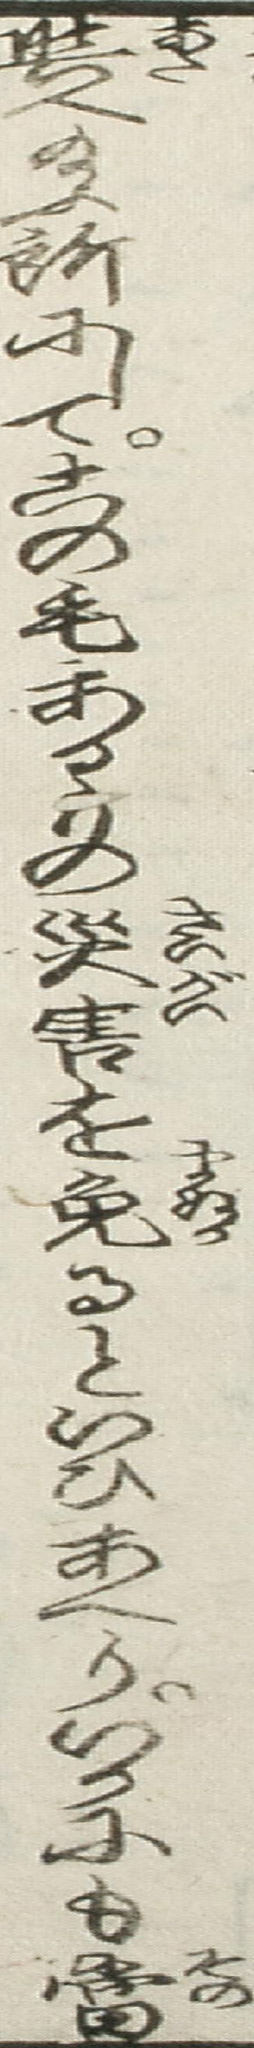與へ給ふ所にして。この毛あるもの災害を免るといひあへり。いかにも当
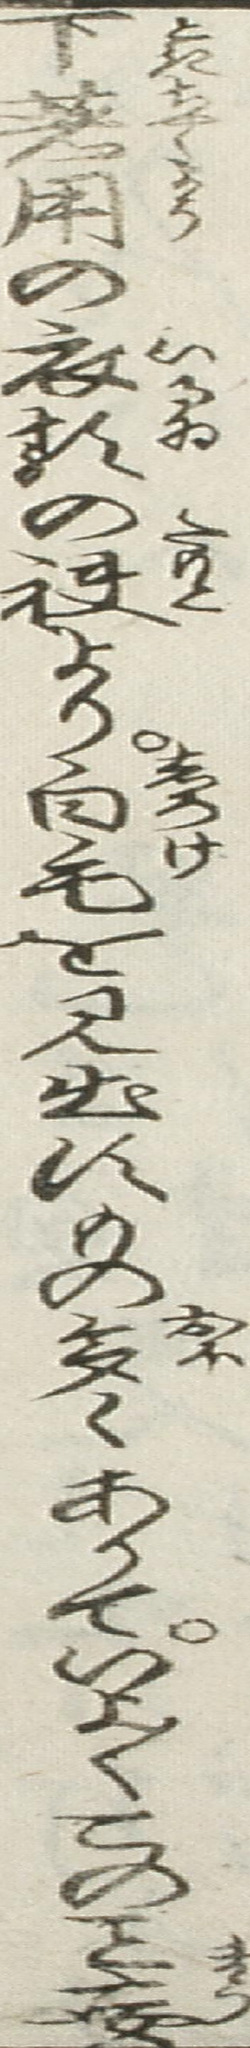下著用の衣類の袂より。白毛を見出すもの多くありて。いよ〳〵このこと妄
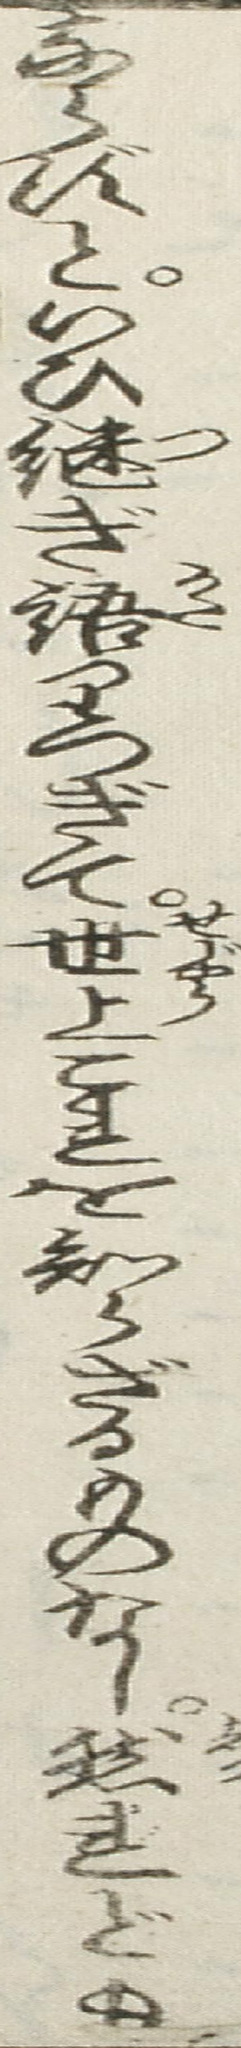ならずと。いひ継ぎ語りつぎて。世上これを知らざるものなし。然れども
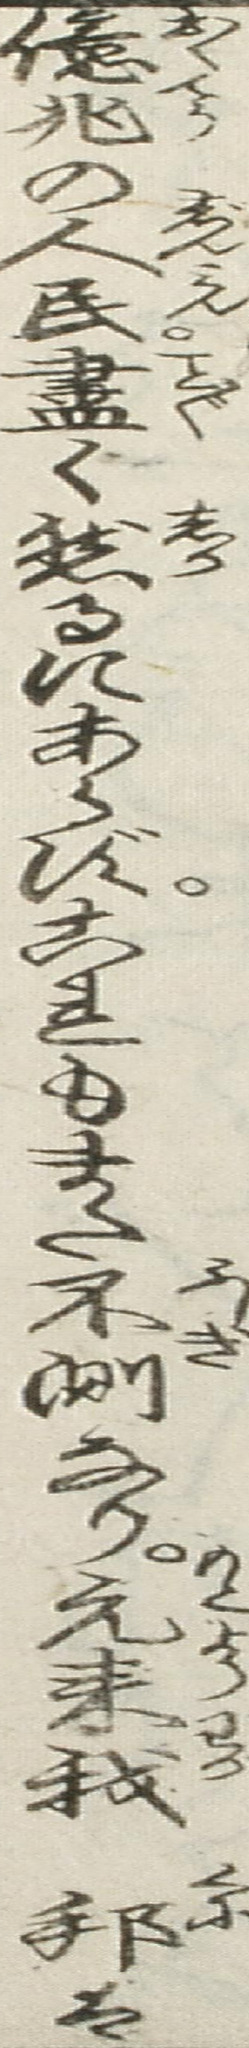億兆の人民盡く然るにあらず。これもまた不測なり。元来我邦は
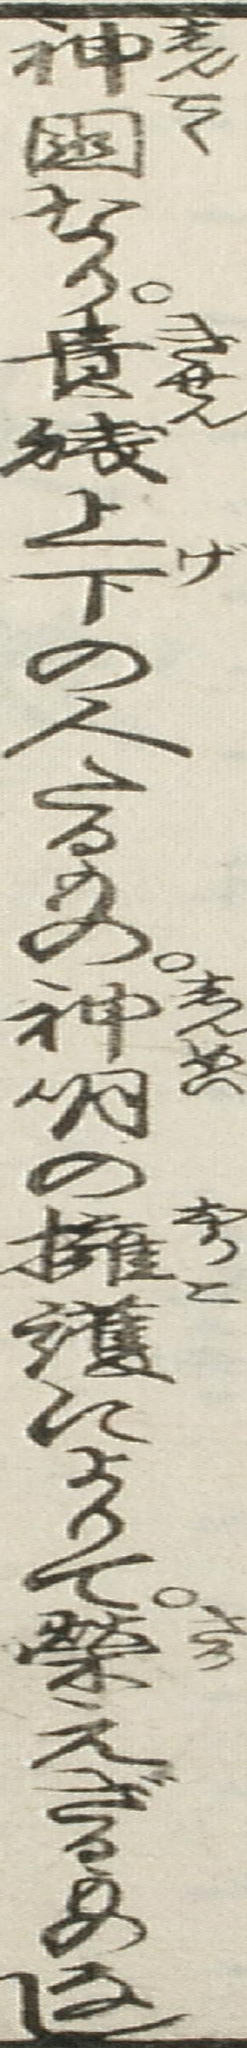神国なり。貴賎上下の人たるもの神明の擁護によりて。栄えざるものなし
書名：安政見聞録　下
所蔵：東京大学地震研究所図書室 Earthquake Research Institute Library, The University of Tokyo, JAPAN
